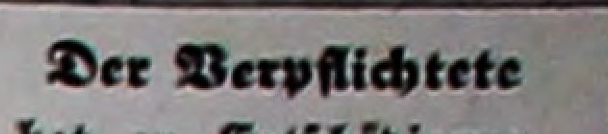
Der Verpflichtete
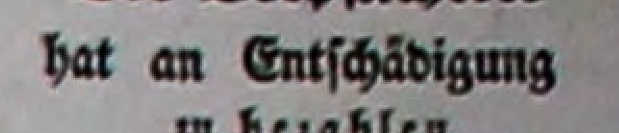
hat an Entschädigung
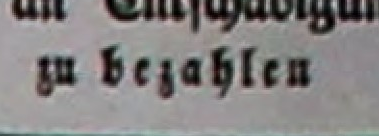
zu bezahlen
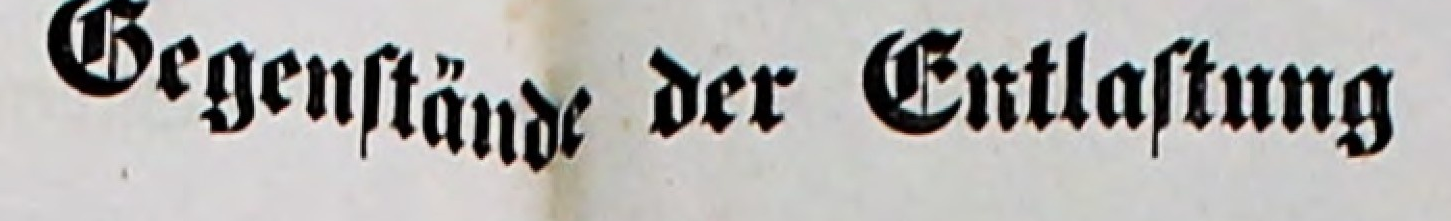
Gegenstände der Entlastung
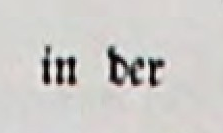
in der
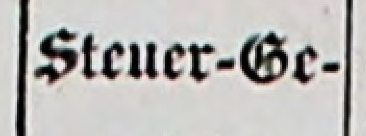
Steuer-Ge-
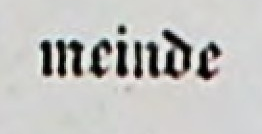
meinde
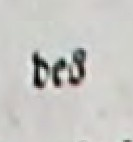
des
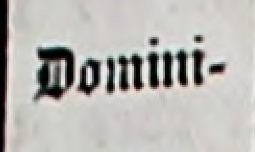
Domini-
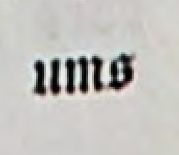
ums
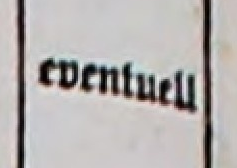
eventuell
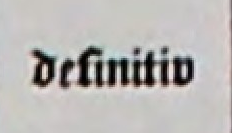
definitiv
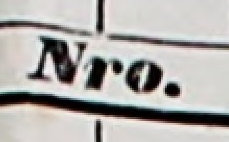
Nro.
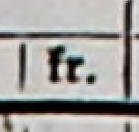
kr.
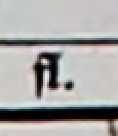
fl.
